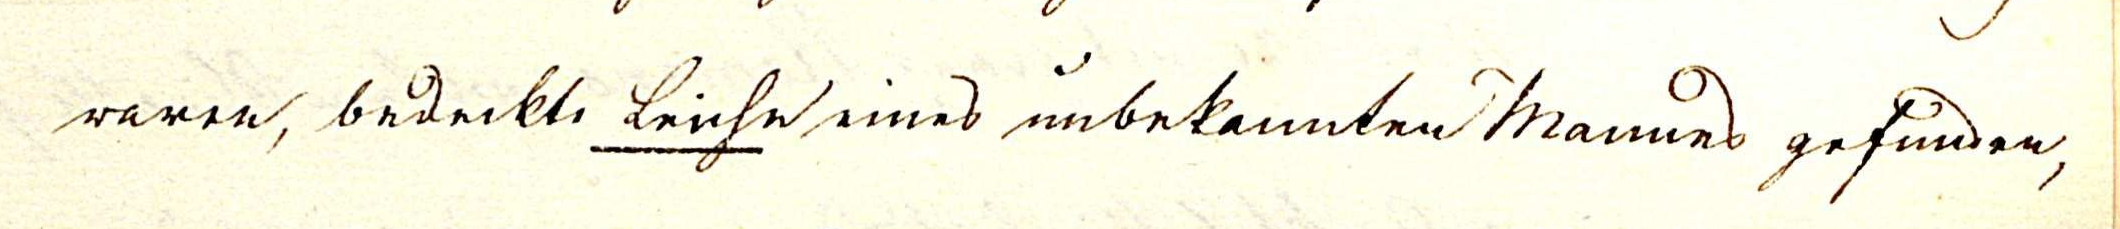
waren, bedeckte Leiche eines unbekannten Mannes gefunden,
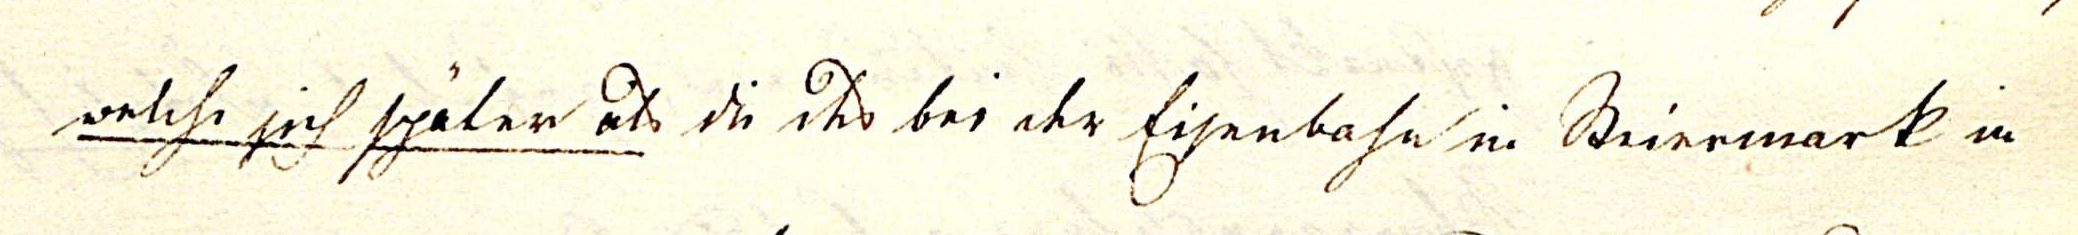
welche sich später als die des bei der Eisenbahn in Steiermark in
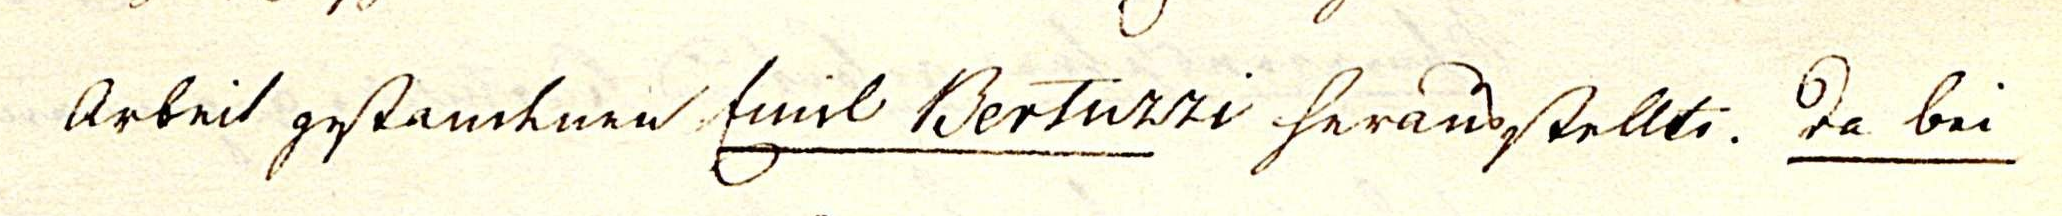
Arbeit gestandenen Emil Bertuzzi herausstellte. Da bei
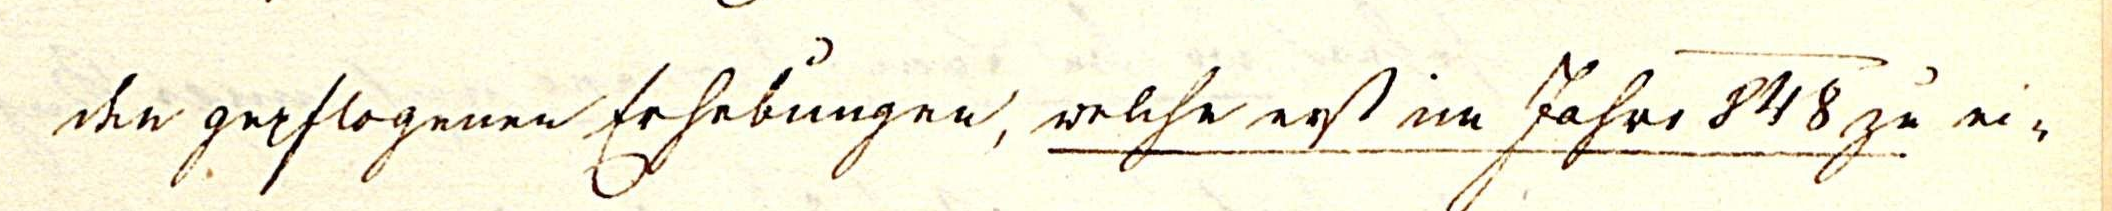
den gepflogenen Erhebungen, welche erst ein Jahre 848 zu ei¬
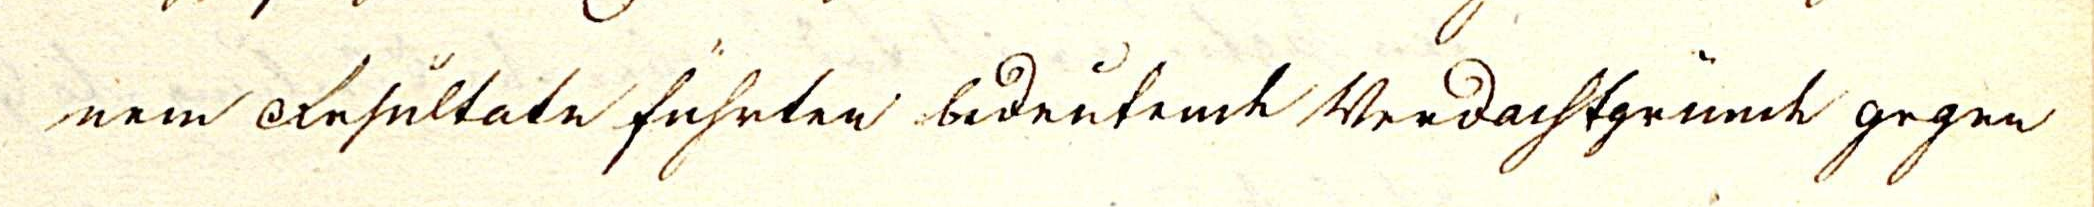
nem Resultate führten bedeutende Verdachtgründe gegen
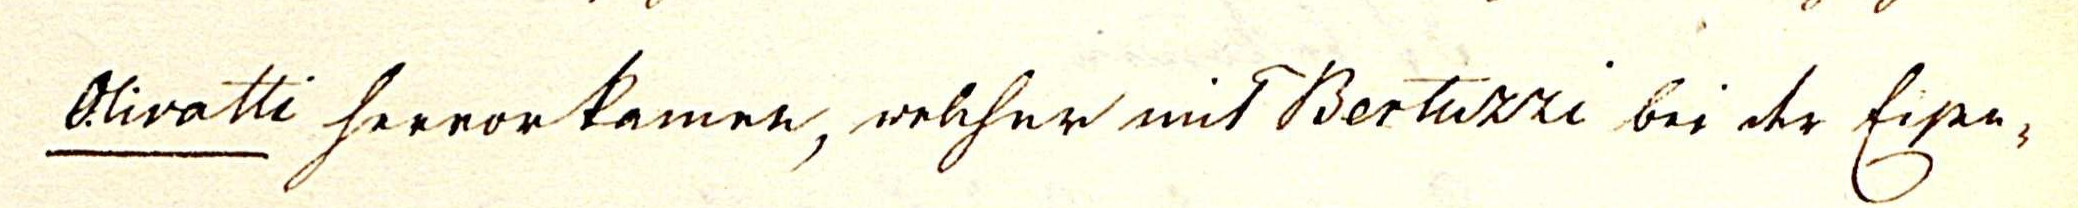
Olivatti hervorkamen, welcher mit Bertuzzi bei der Eisen¬
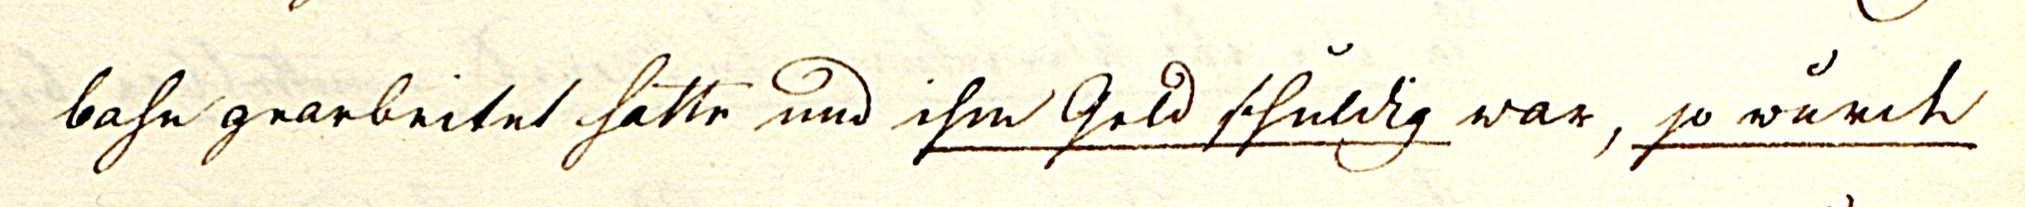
bahn gearbeitet hatte und ihm Geld schuldig war, so wurde
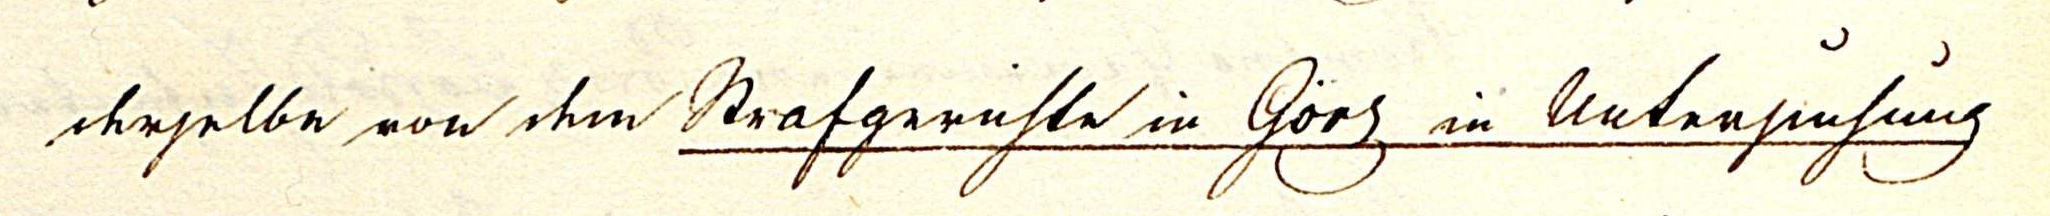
derselbe von dem Strafgerichte in Görz in Untersuchung
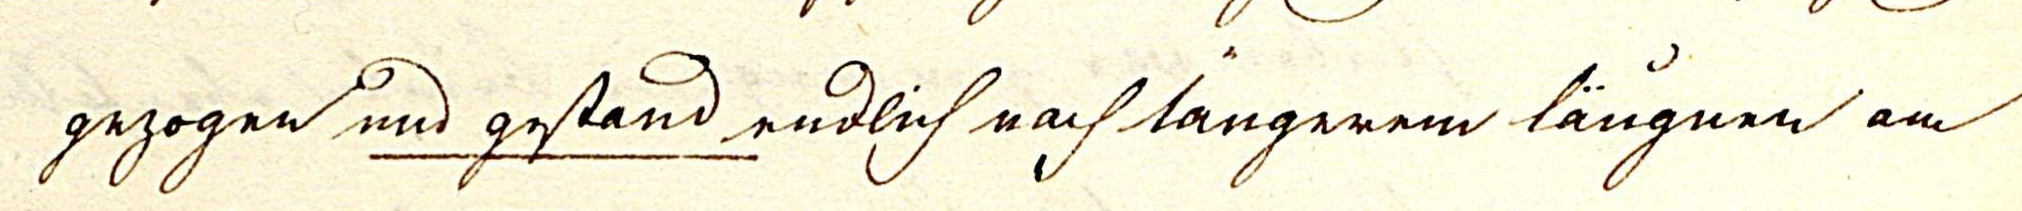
gezogen und gestand endlich nach längerem läugnen am
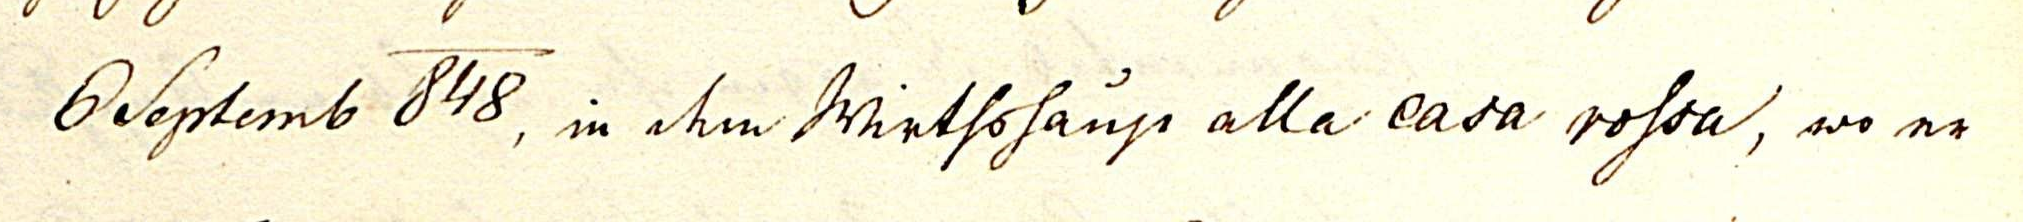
6 Septemb. 848, in dem Wirtshaus alla casa rossa, wo er
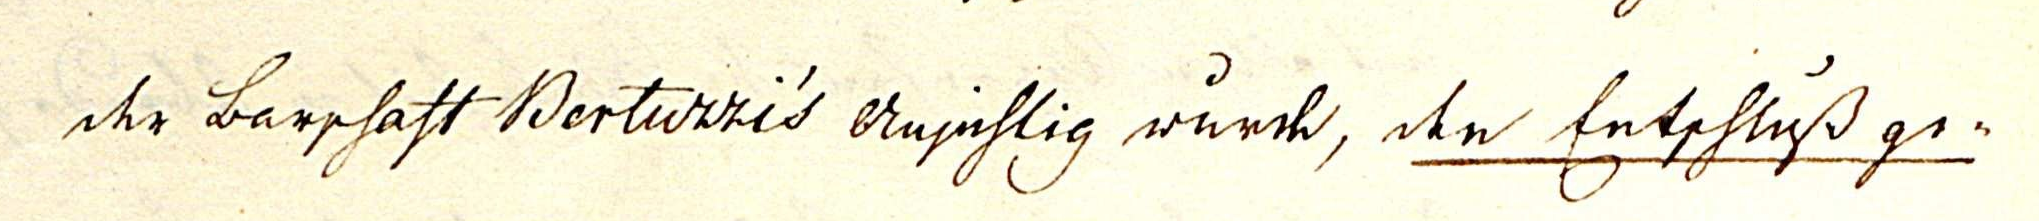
der Barschaft Bertuzzi’s Ansichtig wurde, den Entschluß ge¬
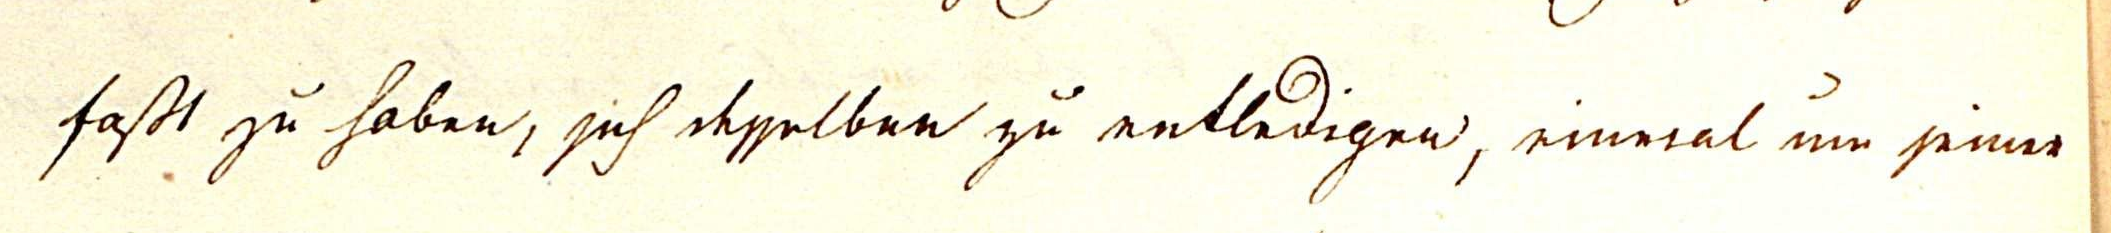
faßt zu haben, sich desselben zu entledigen, einmal um seiner
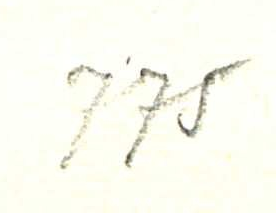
775
